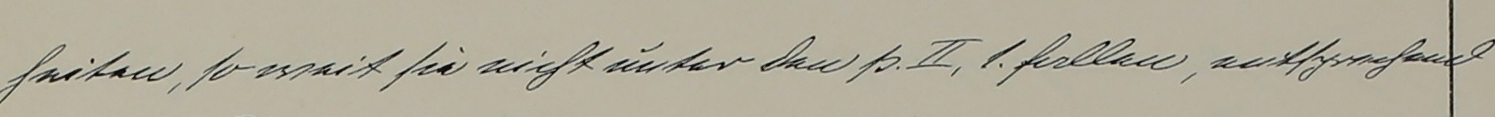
heiten, soweit sie nicht unter den p. II.1 fallen, entsprechend
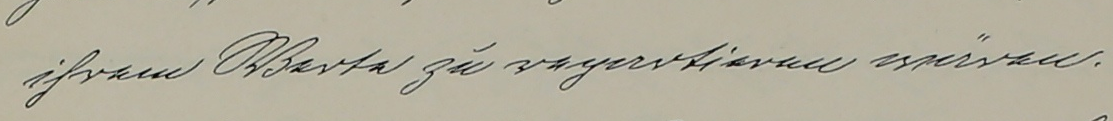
ihrem Werte zu repartieren wären.
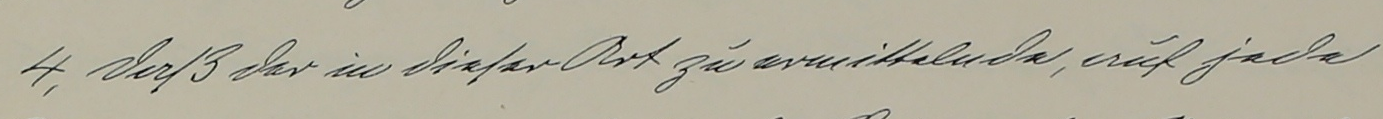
4. daß der in dieser Art zu ermittelnde, auf jede
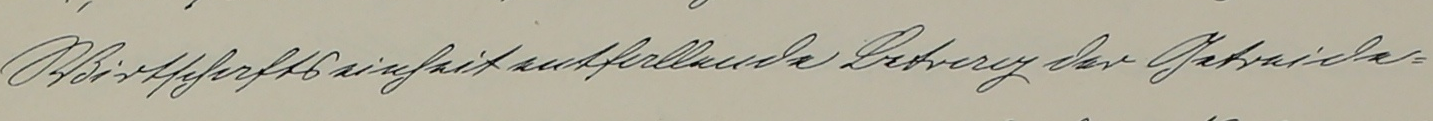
Wirtschaftseinheit entfallende Betrag der Getreide-
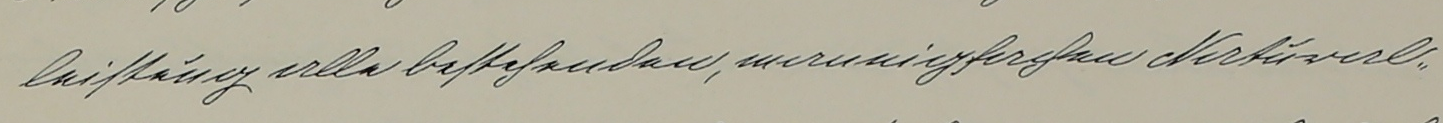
leistung alle bestehenden, mannigfachen Natural-
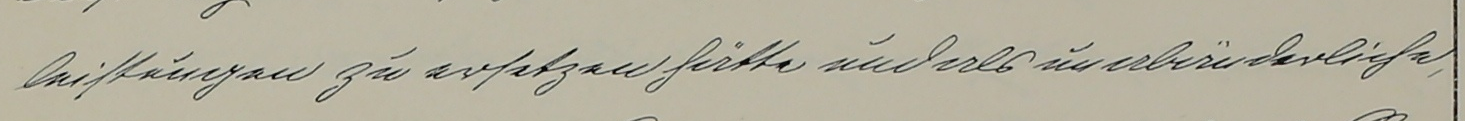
leistungen zu ersetzen hätte und als unabänderliche,
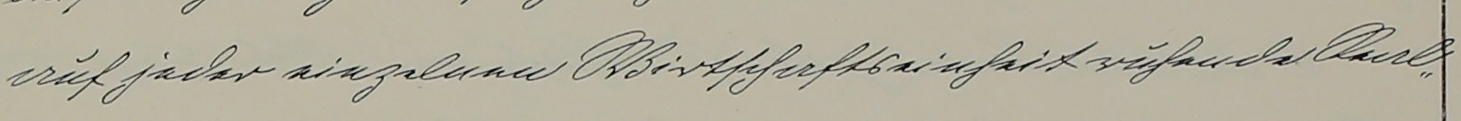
auf jeder einzelnen Wirtschaftseinheit ruhende Real-
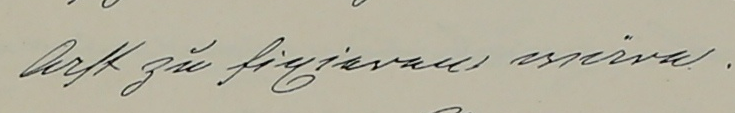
last zu fixieren wäre.
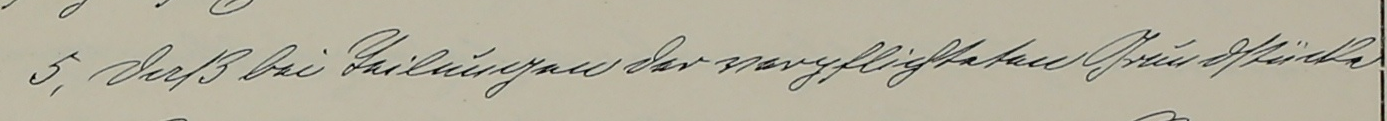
5. daß bei Teilungen der verpflichteten Grundstücke
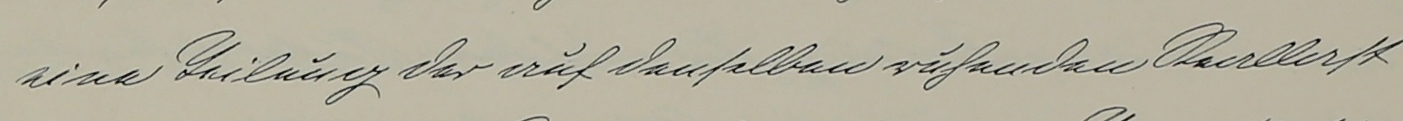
eine Teilung der auf denselben ruhenden Reallast
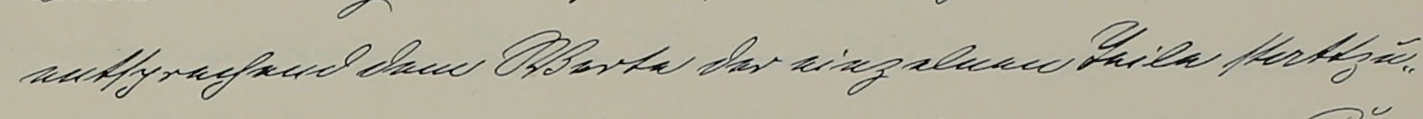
entsprechend dem Werte der einzelnen Teile stattzu-
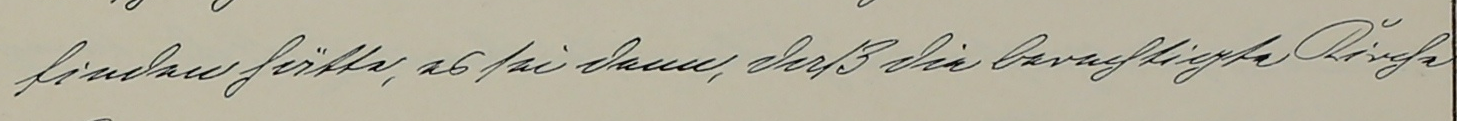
finden hätte, es sei denn, daß die berechtigte Kirche
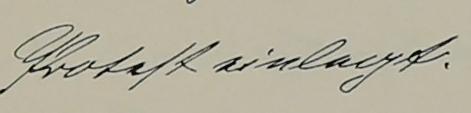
Protest einlegt.
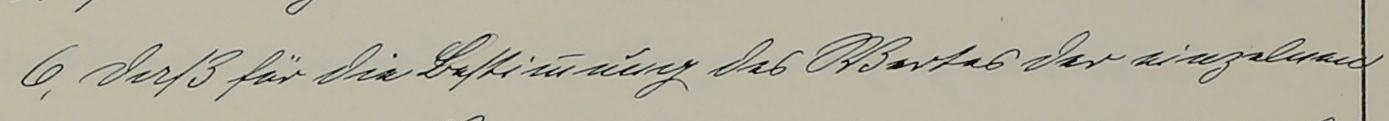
6. Daß für die Bestimmung des Wertes der einzelnen
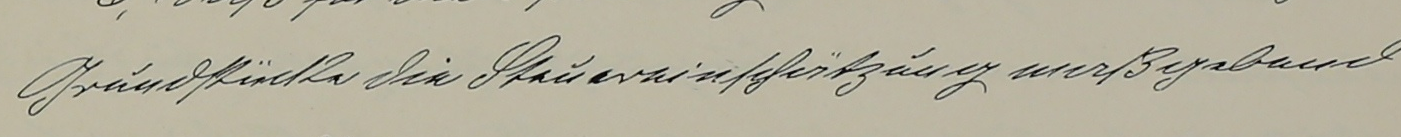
Grundstücke die Steuereinschätzung maßgebend
